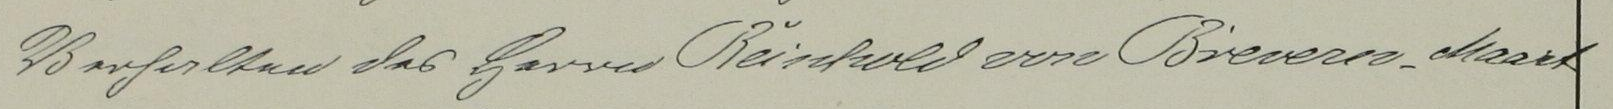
Verhalten des Herrn Reinhold von Brevern-Maart
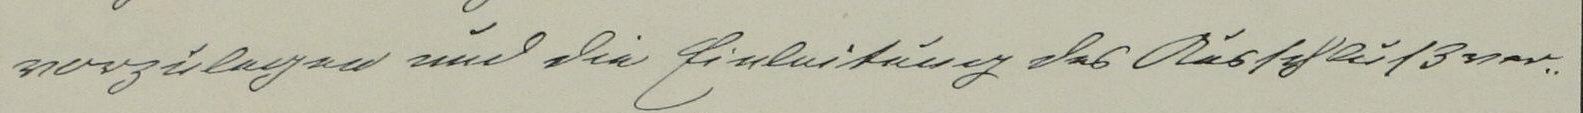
vorzulegen und die Einleitung des Ausschlußver-
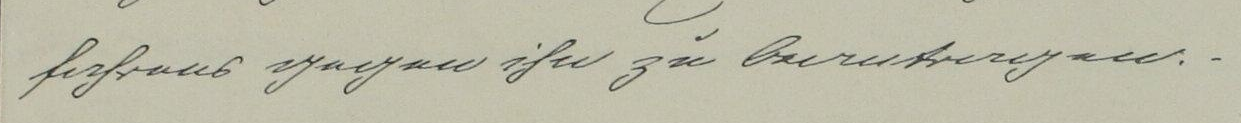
fahrens gegen ihn zu beantragen.
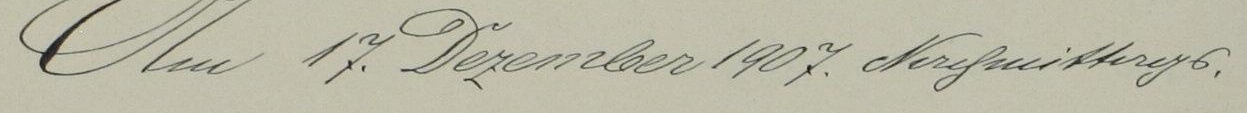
Am 17. Dezember 1907. Nachmittags.
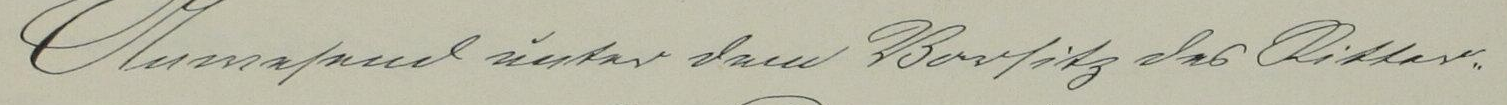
Anwesend unter dem Vorsitz des Ritter-
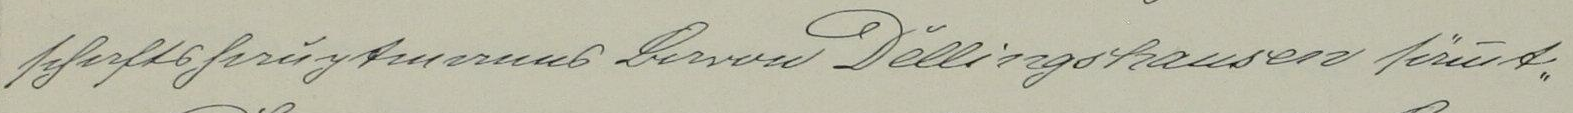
schaftshauptmanns Baron Dellingshausen sämmt-
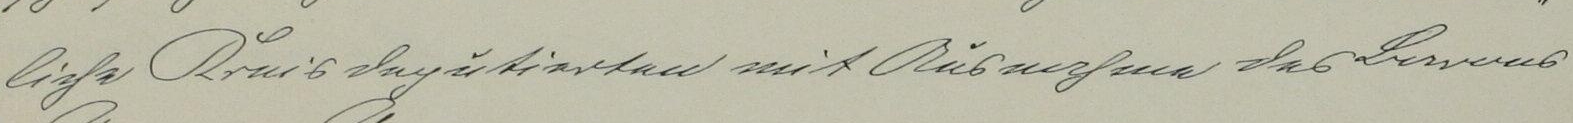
liche Kreisdeputierten mit Ausnahme des Barons
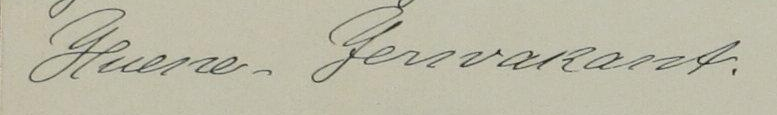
Huene-Jerwakant.
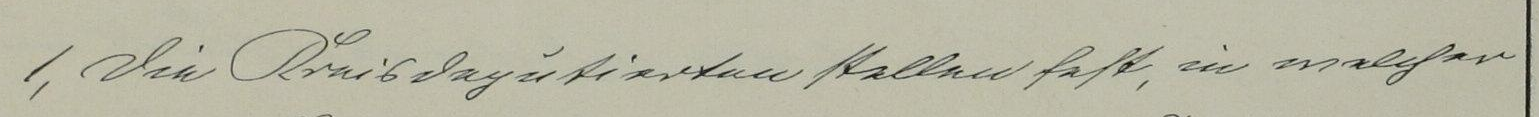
1. Die Kreisdeputierten stellen fest, in welcher
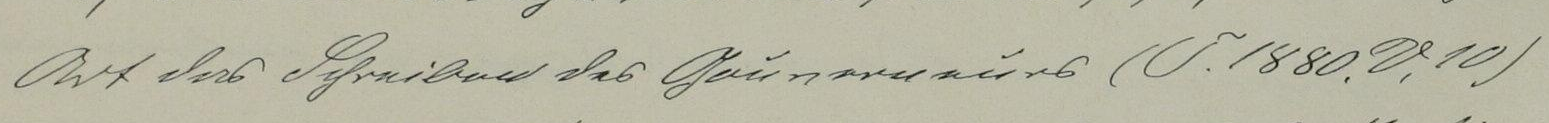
Art das Schreiben des Gouverneurs (T.1880. V.10)
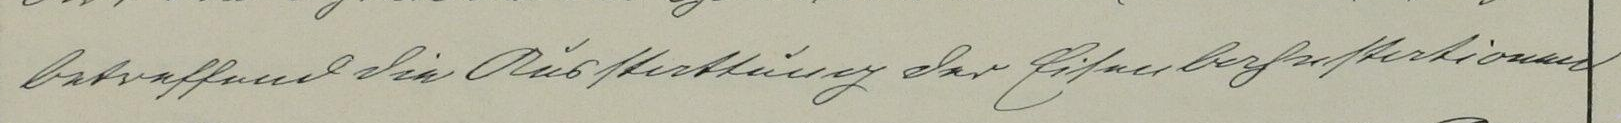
betreffend die Ausstattung der Eisenbahnstationen
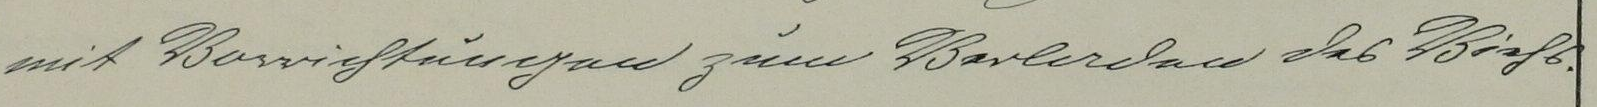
mit Vorrichtungen zum Verladen des Viehs
